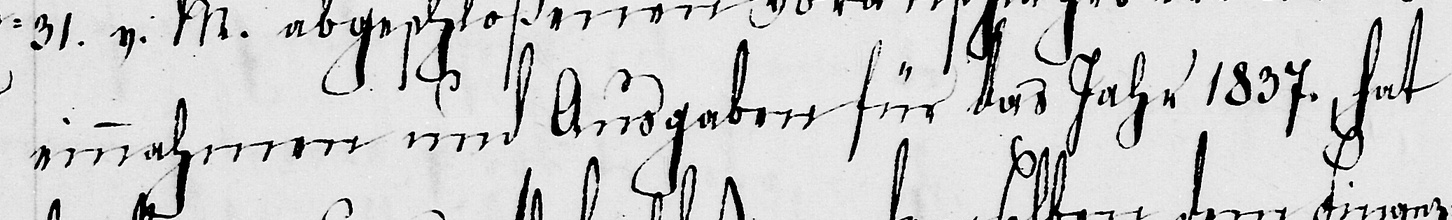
einnahmen und Ausgaben für das Jahr 1837., hat
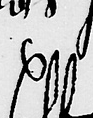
Mit
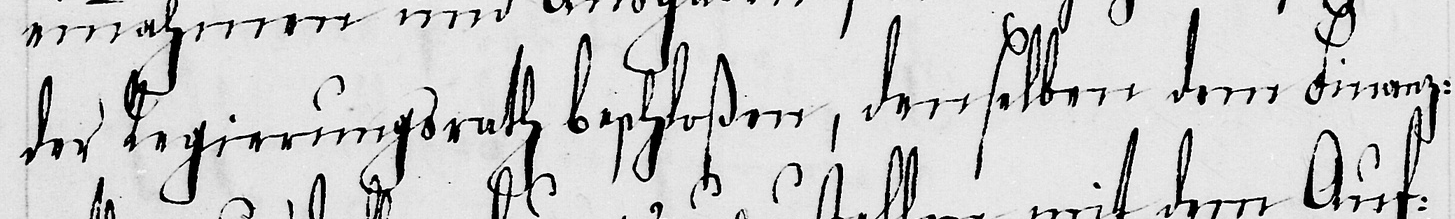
der Regierungsrath beschloßen, denselben dem Finanz¬
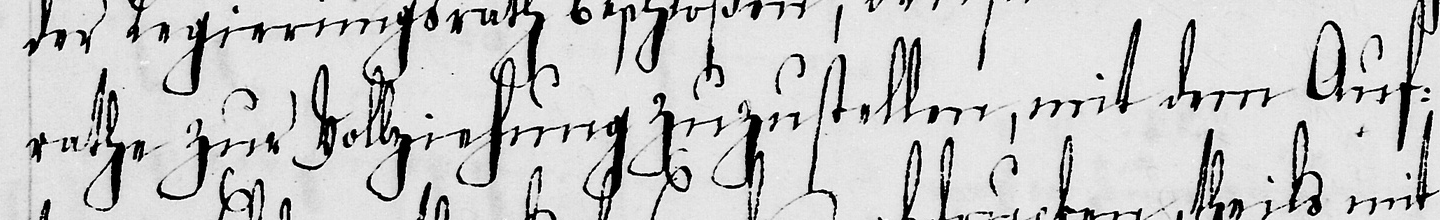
rathe zur Vollziehung zuzustellen, mit dem Auf¬
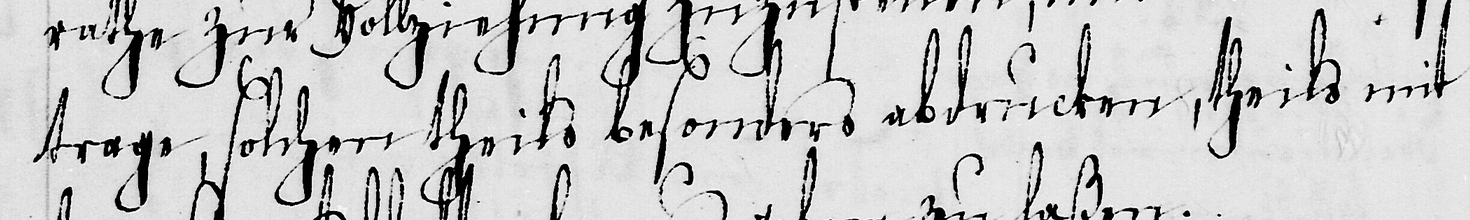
trage, solchen theils besonders abdrucken, theils mit
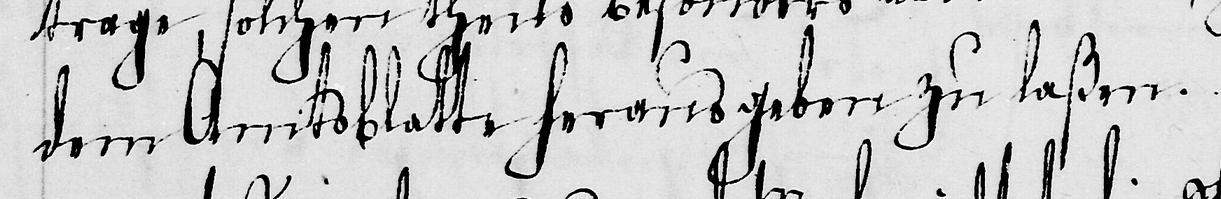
dem Amtsblatte herausgeben zu laßen.
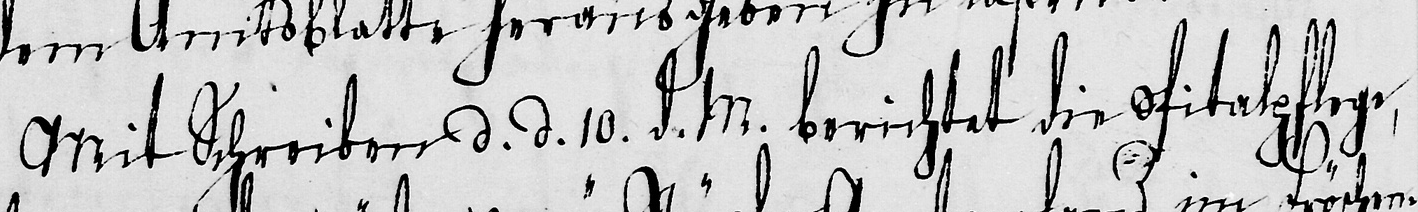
reiben d. d. 10. d. M. berichtet die Spitalpfle¬
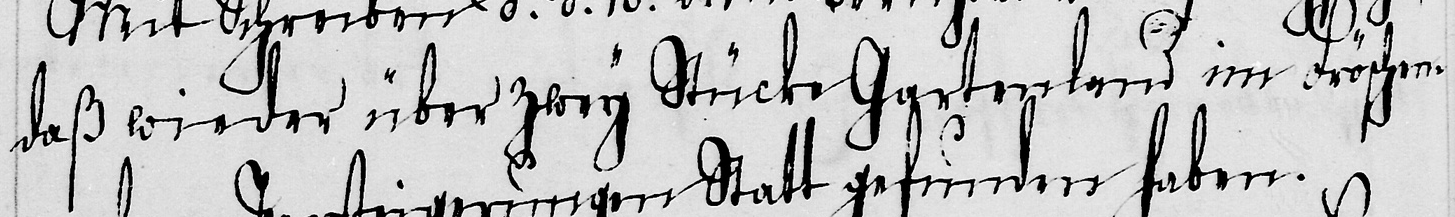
daß wieder über zwey Stücke Gartenland im Fröschen¬
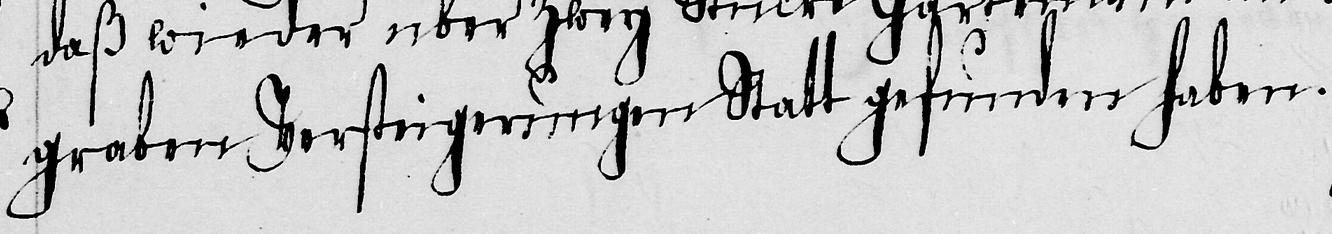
graben Versteigerungen Statt gefunden haben.
